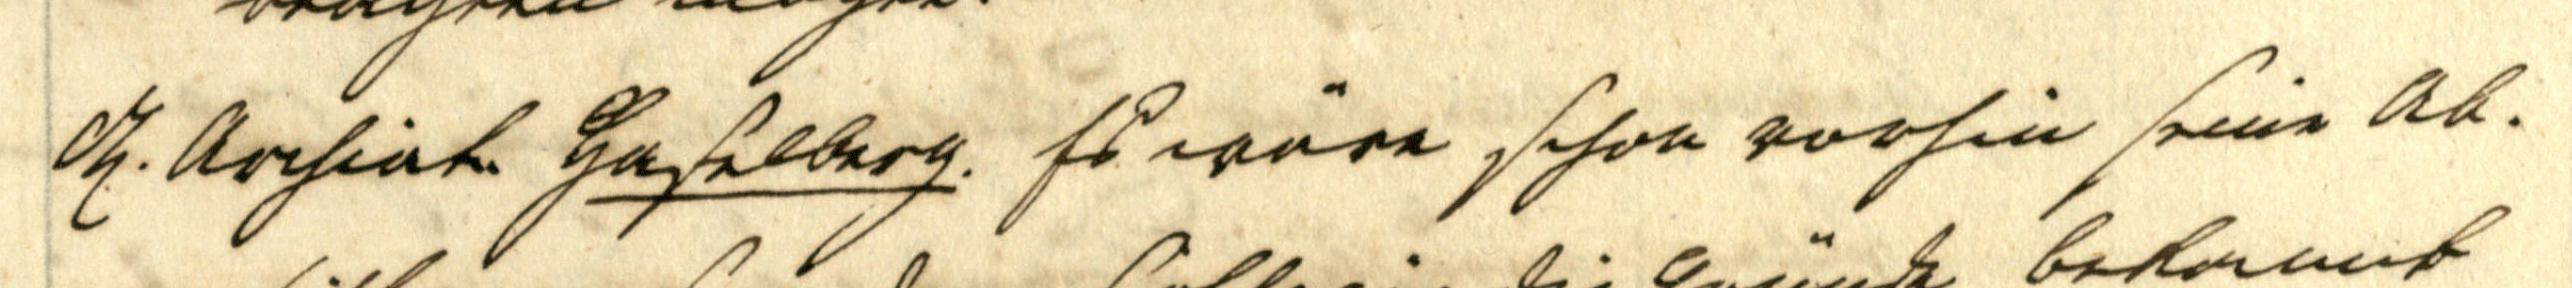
dh. Archiat. Haselberg. Es wäre schon vorhin seine Ab¬
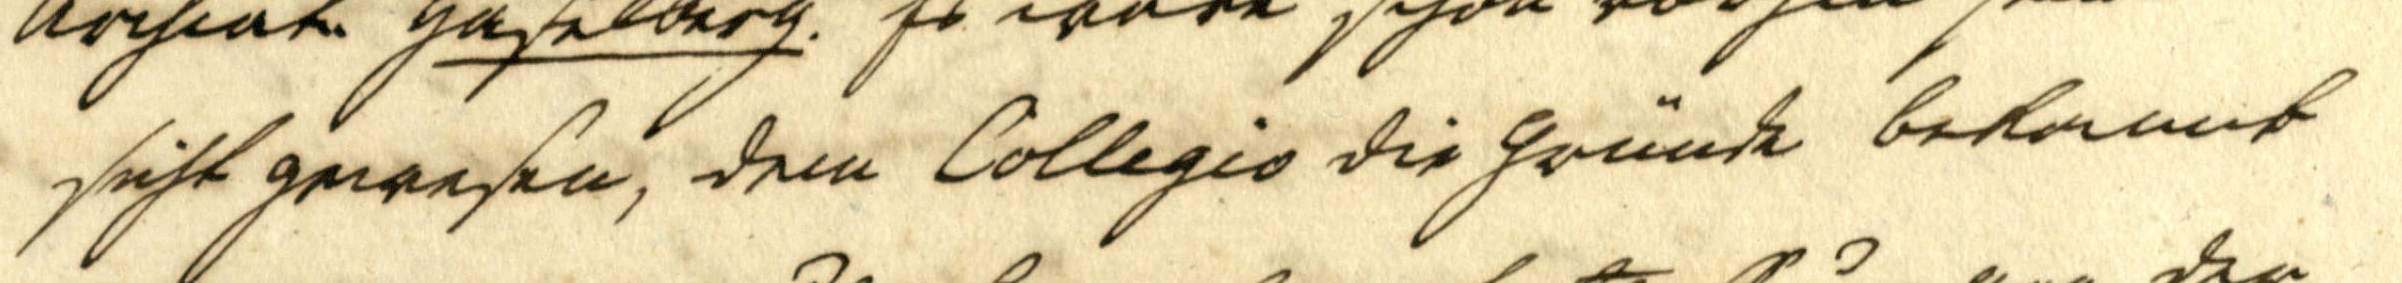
sicht gewesen, dem Collegio die Gründe bekannt
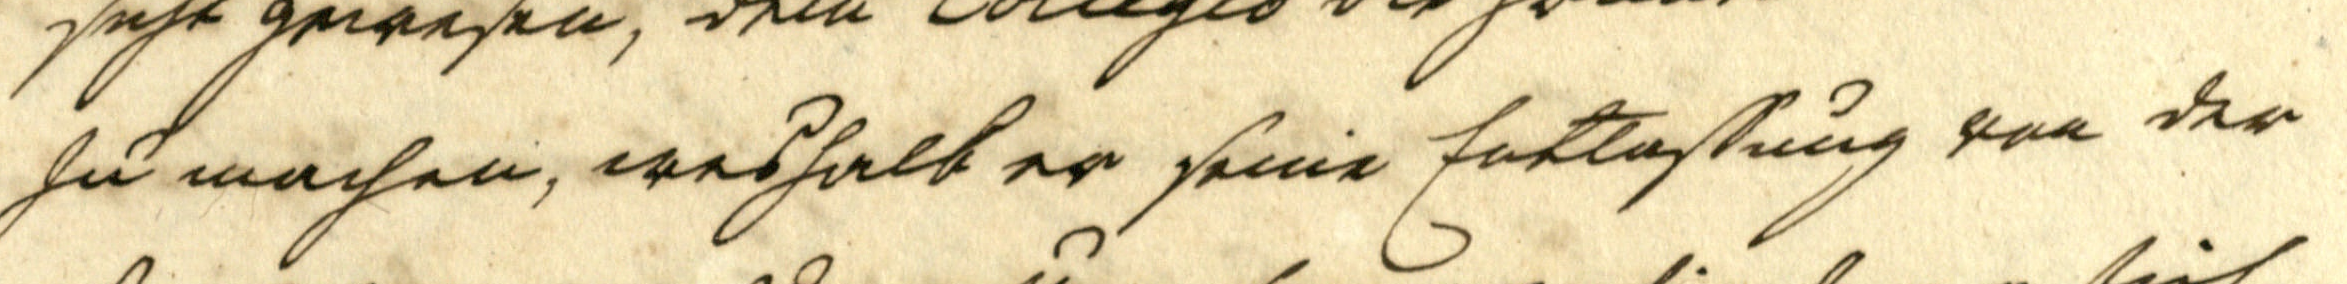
zu machen, weshalb er seine Entlassung von der
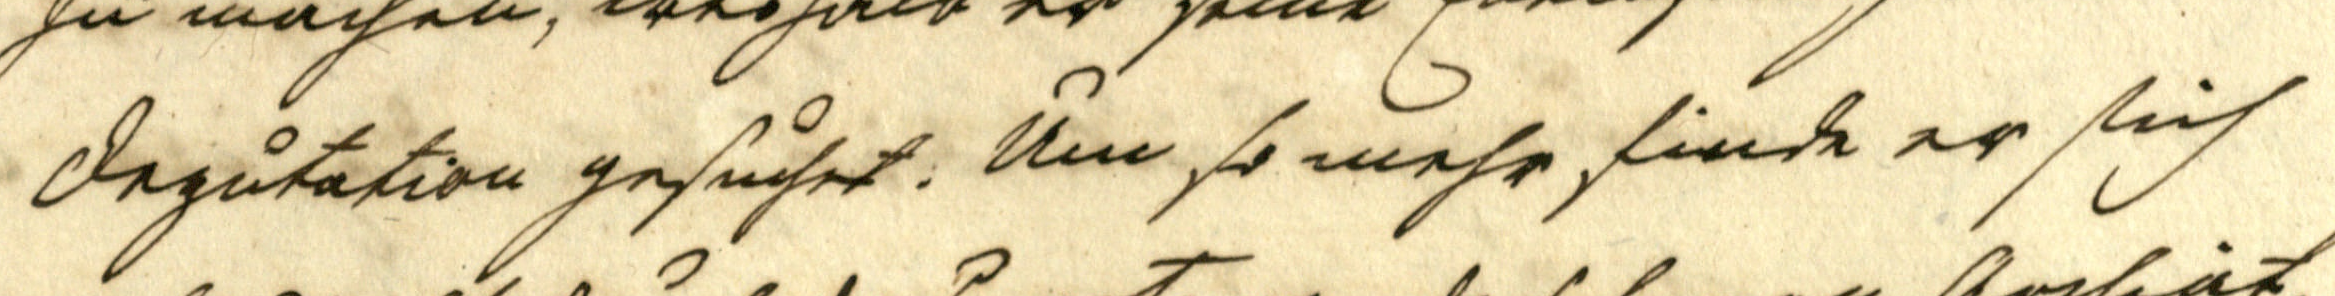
Deputation gesuchet. Um so mehr finde er sich
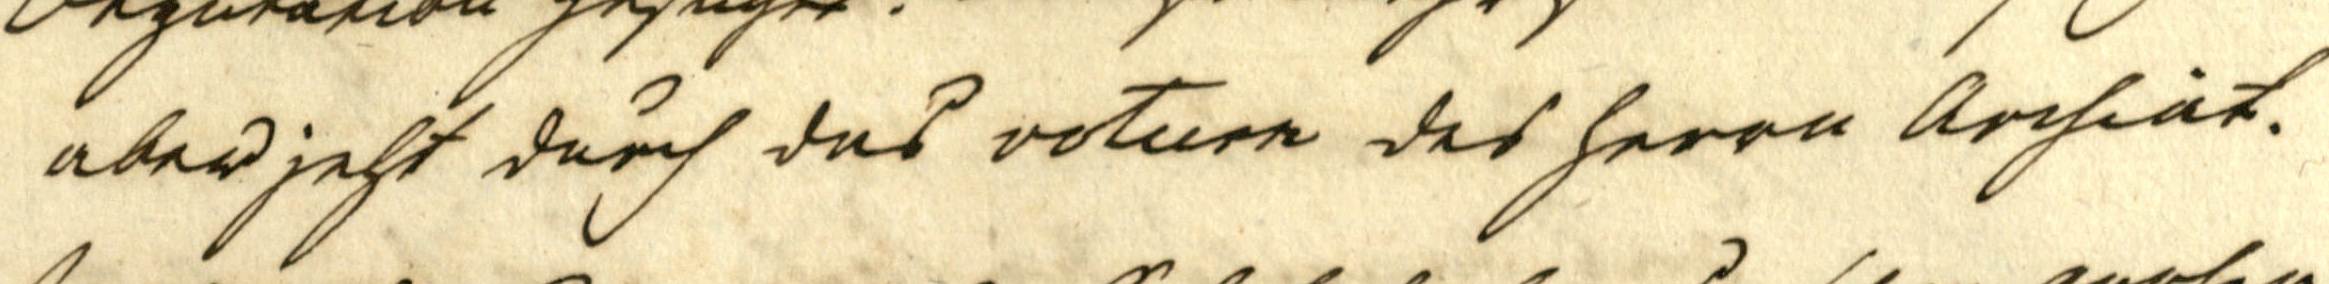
aber jetzt durch das votum des Herrn Archiat.
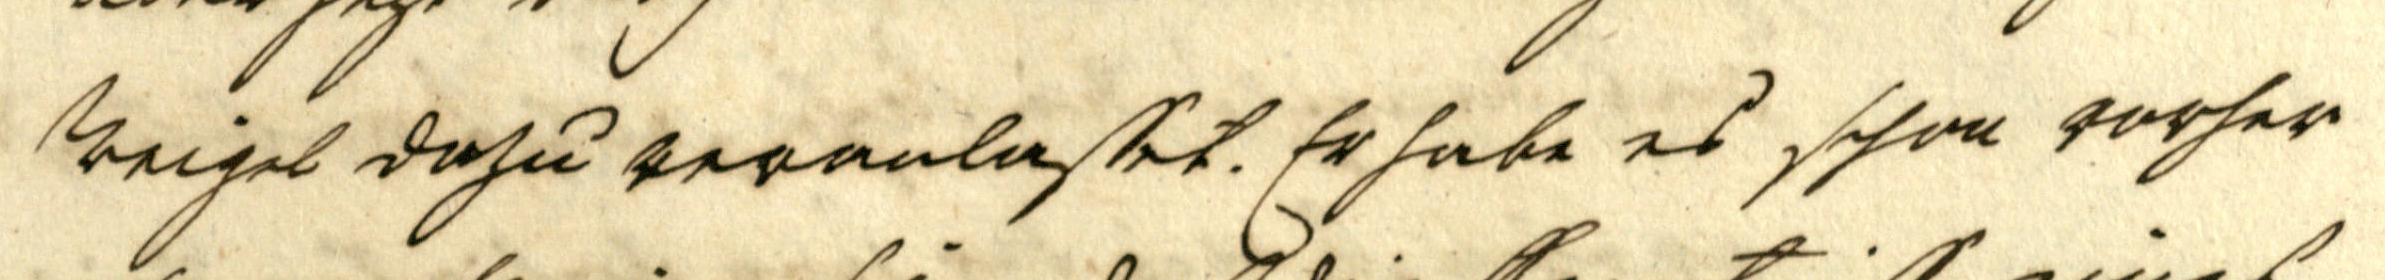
Weigel dazu veranlasset. Er habe es schon vorher
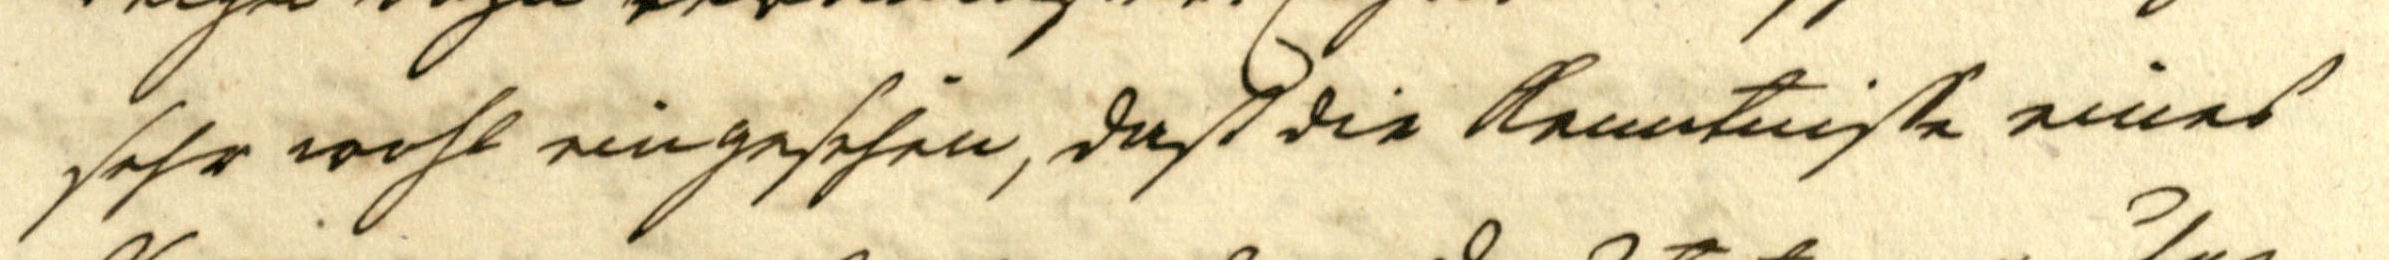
sehr wohl eingesehen, daß die Kenntnisse eines
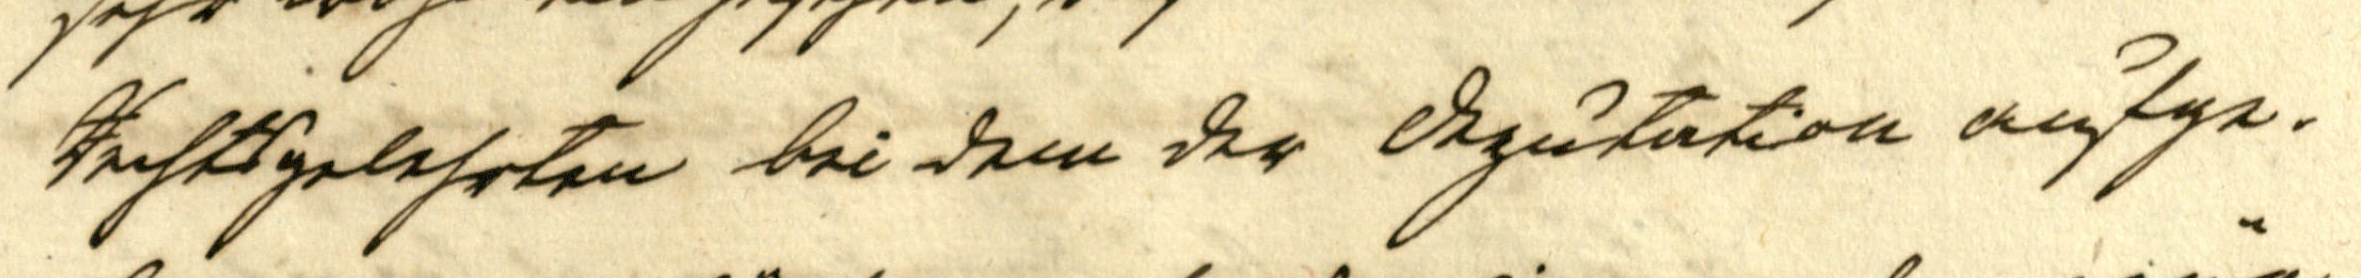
Rechtsgelehrten bei dem der Deputation aufge¬
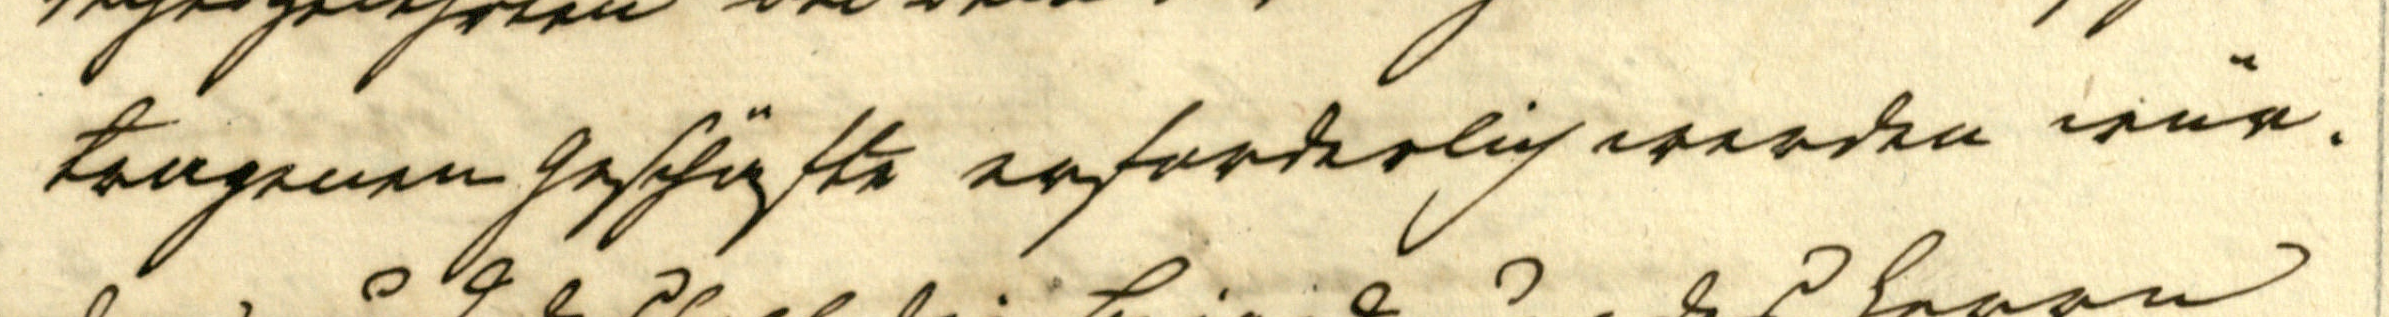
tragenen Geschäfte erforderlich werden wür¬
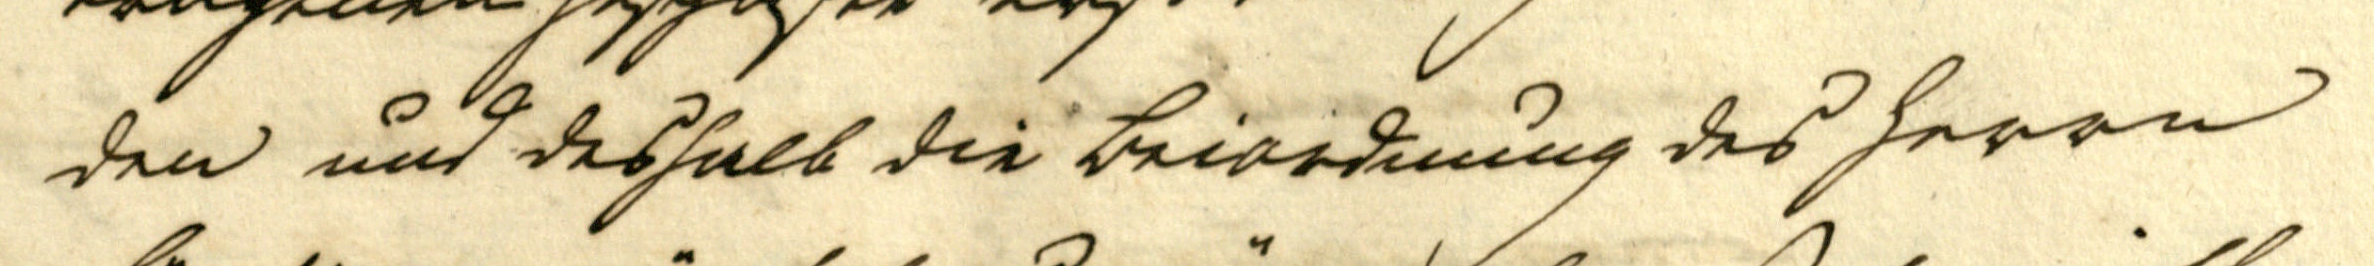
den und deshalb die Beiordnung des Herrn
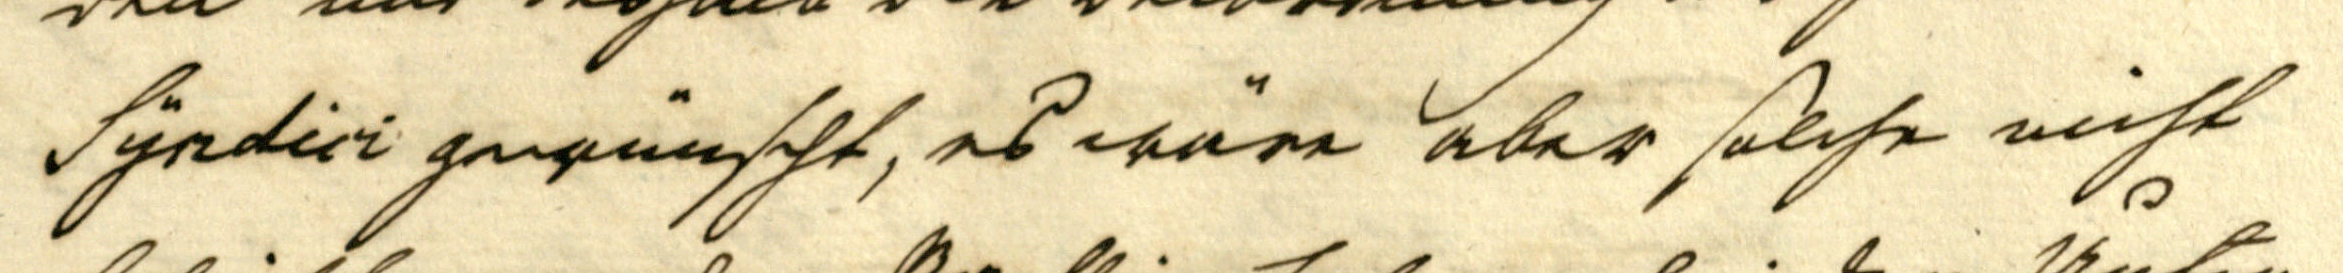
Sÿndici gewünscht, es wäre aber solche nicht
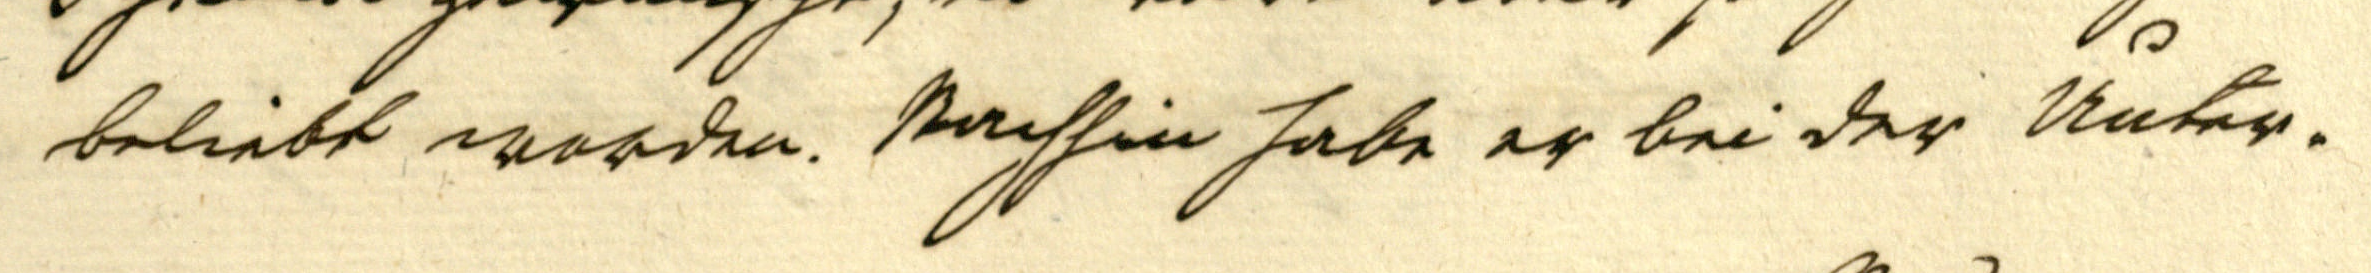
beliebt worden. Nachhin habe er bei der Unter¬
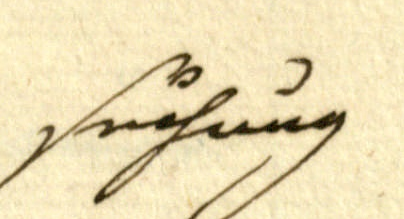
suchung
